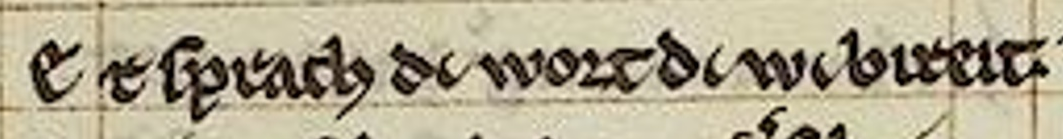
Er ſprach d(az) wort d(az) w(az) bireit.
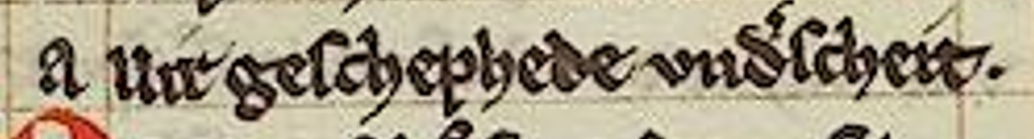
Allir geſchephede vnd(er)ſcheit.
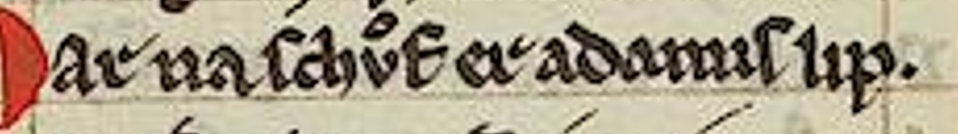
*Dar na ſchv°of er adamiſ lip.
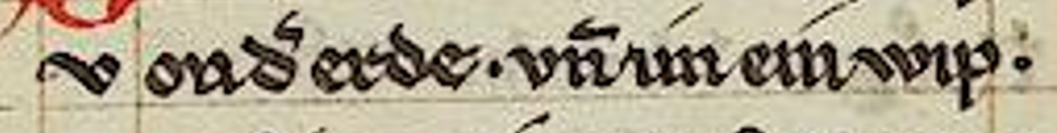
Von d(er) erde. vn(d) im ein wip.
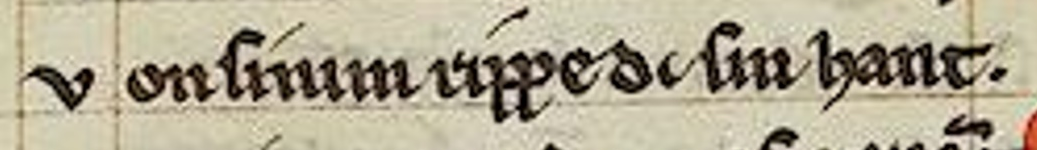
Von ſinim rippe d(az) ſin hant.
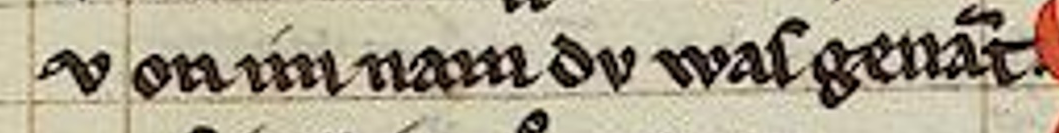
Von im nam dv waſ gena(n)t.
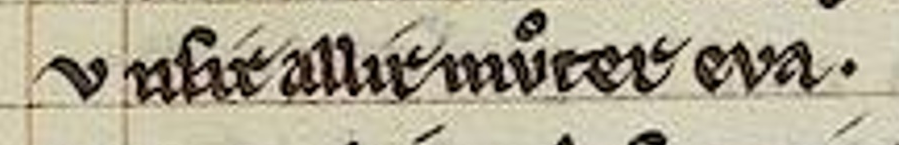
Vnſir allir mv°oter eva.
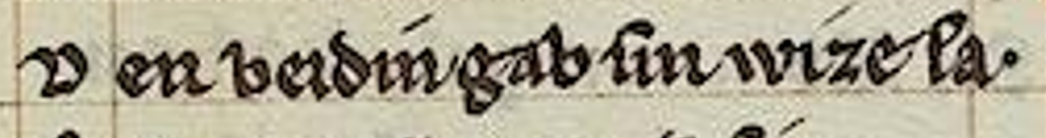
Den beidin gab ſin wize ſa.
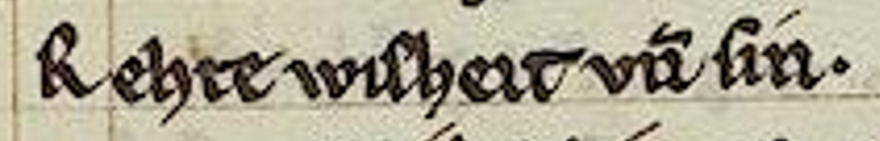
Rehte wiſheit vn(d) ſin.
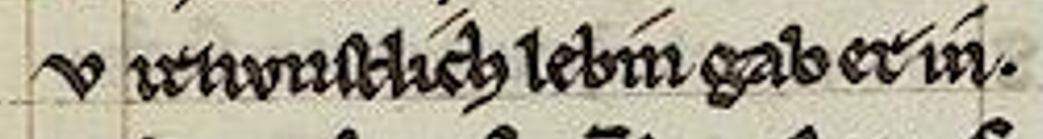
Virnvnſtlich lebin gab er in.
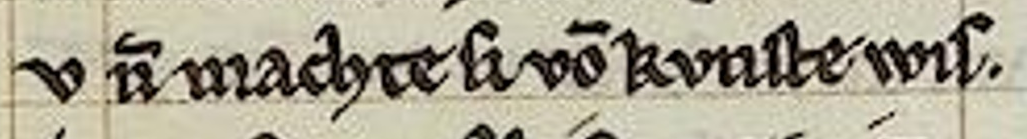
Vn(d) machte ſi vo(n) kvnſte wiſ.
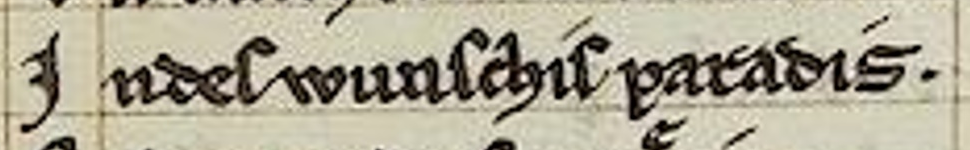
Indeſ wunſchiſ paradis.
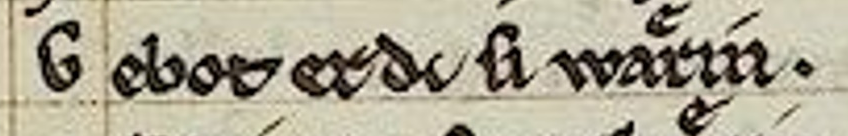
Gebot er d(az) ſi wa°erin.
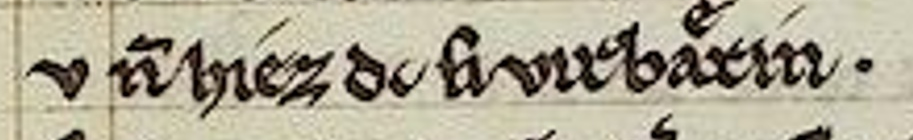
Vn(d) hiez d(az) ſi virba°erin.
